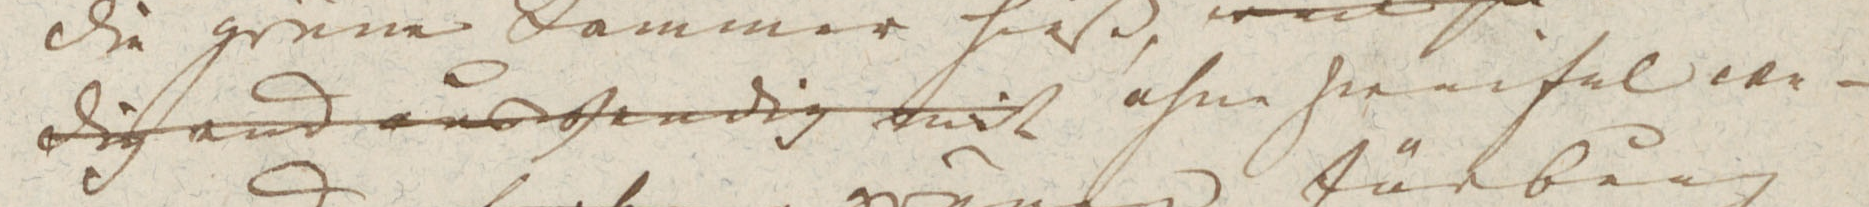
dig und auswendig mit ohne Zweifel we-
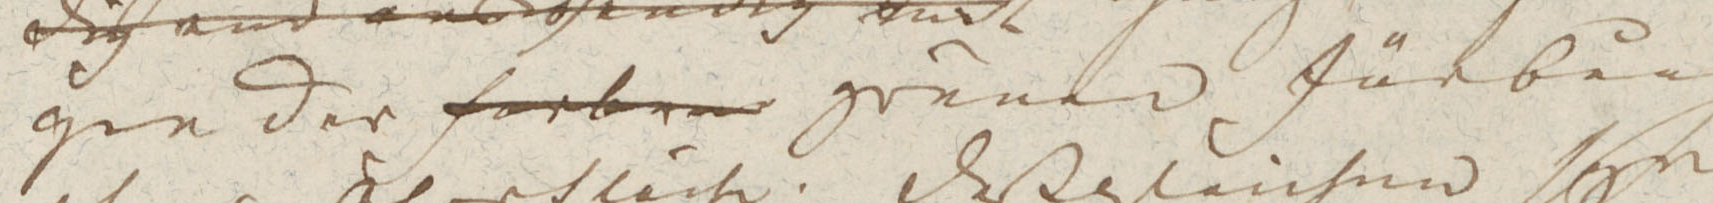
gen der Farben grünen Färbung
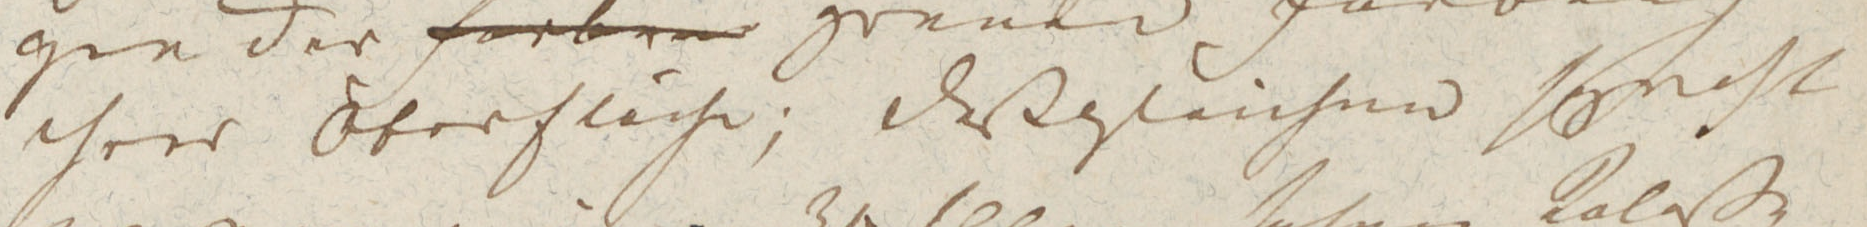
ihrer Oberfläche; Dessgleichen spricht
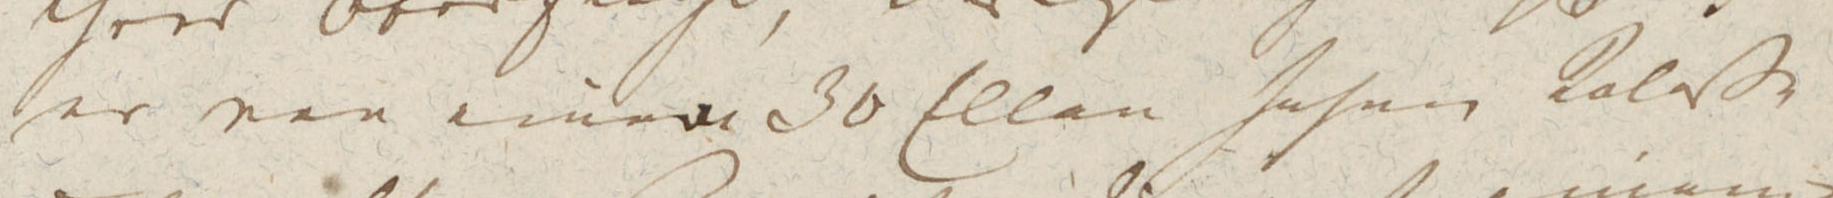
er von einerm 30 Ellen hohen Kolosse
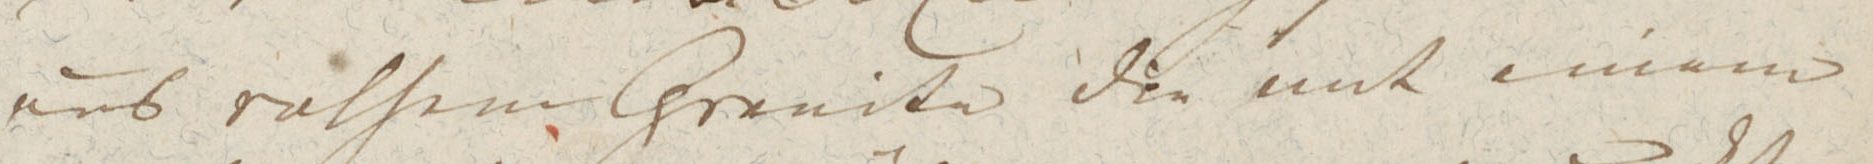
aus rothem Granite die mit einem
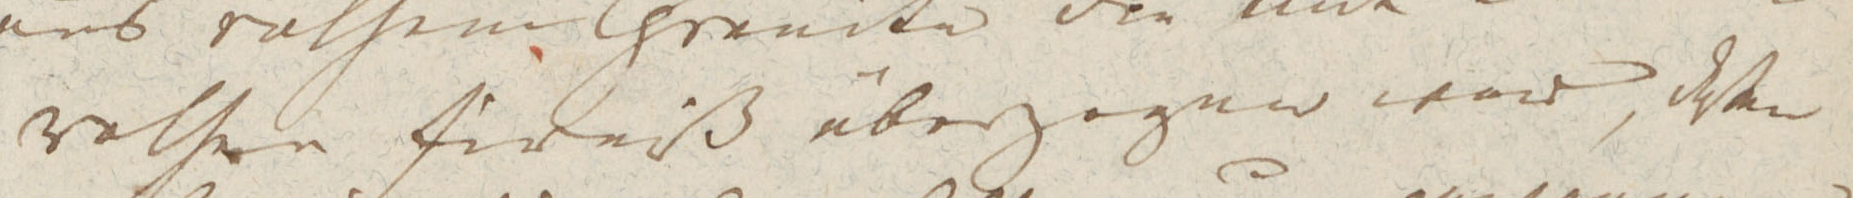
rothen Firniss überzogen war, dessen
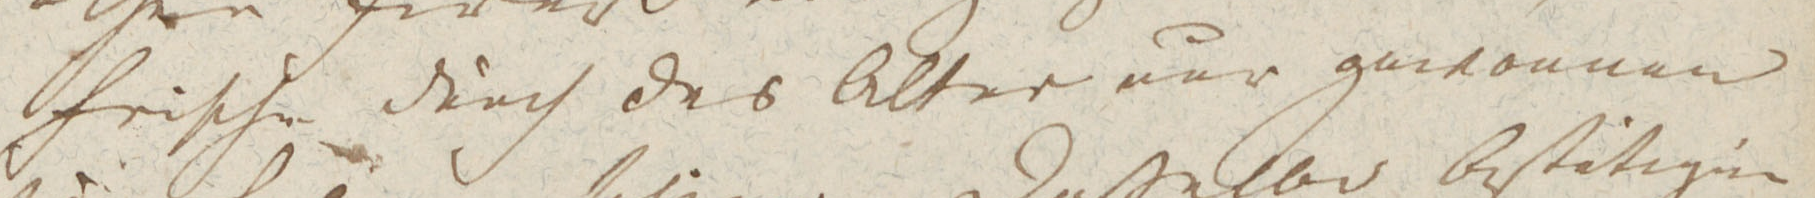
Frische durch das Alter nur gewonnen
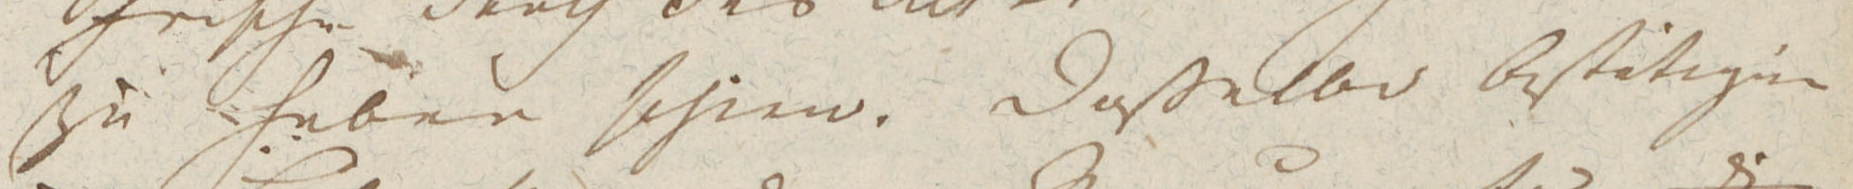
zu haben schien. Dasselbe bestätigen
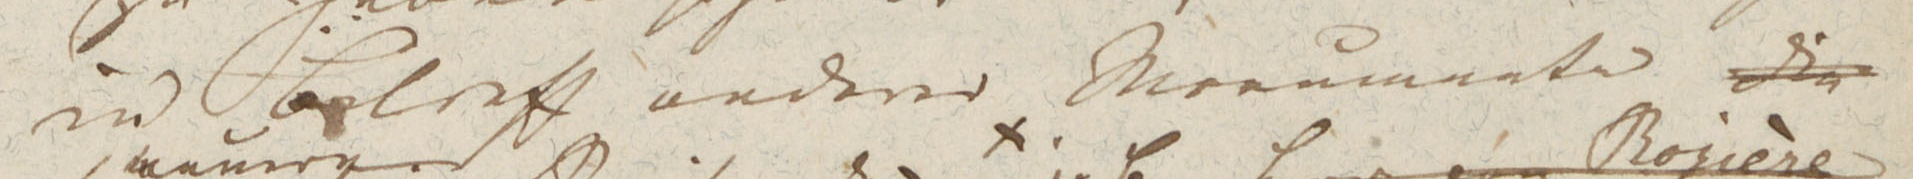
in Betreff anderer Monumente die
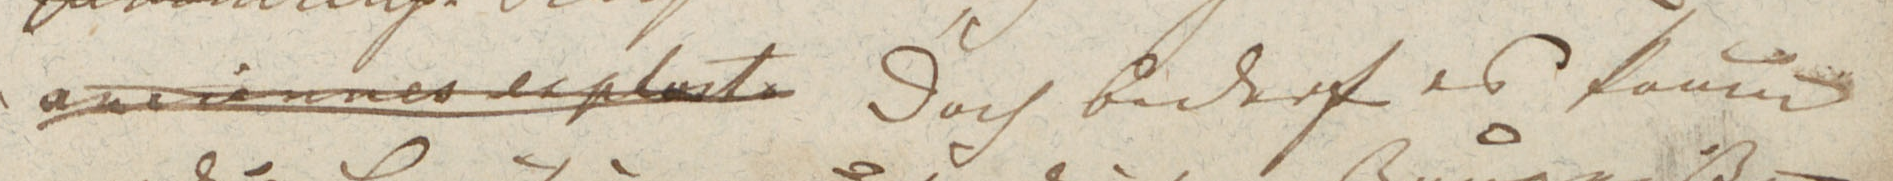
anciennes exploit Doch bedarf es kaum
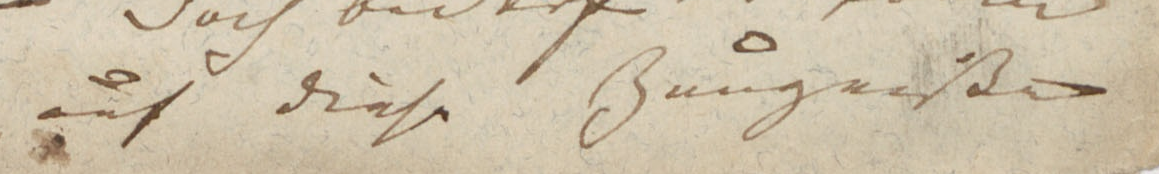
auf diese Zeugnisse
